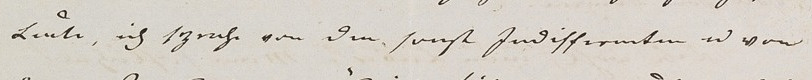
Leute, ich spreche von den sonst Indifferenten u von
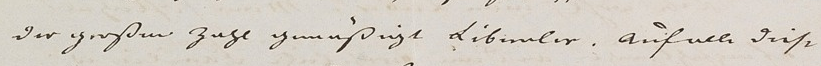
der großen Zahl gemäßigt Liberaler. Auf alle diese
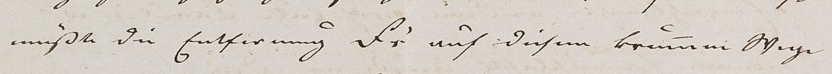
müßte die Entfernung F's auf diesem krummen Wege
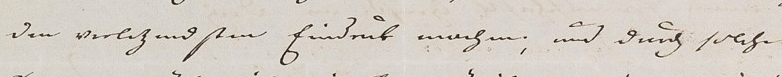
den verletzendsten Eindruk machen; und durch solche
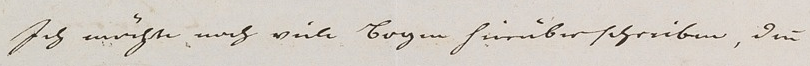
Ich möchte noch viele Bogen hierüber schreiben, denn
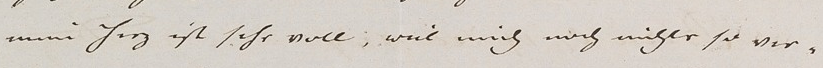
mein Herz ist sehr voll, weil mich noch nichts so ver-
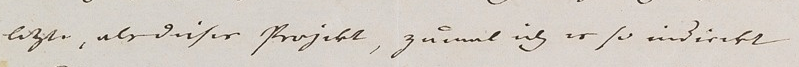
letzte, als dieses Projekt, zumal ich es so indirekt
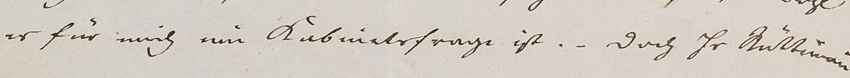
es für mich eine Kabinetsfrage ist. – Doch Hr Rüttimann
